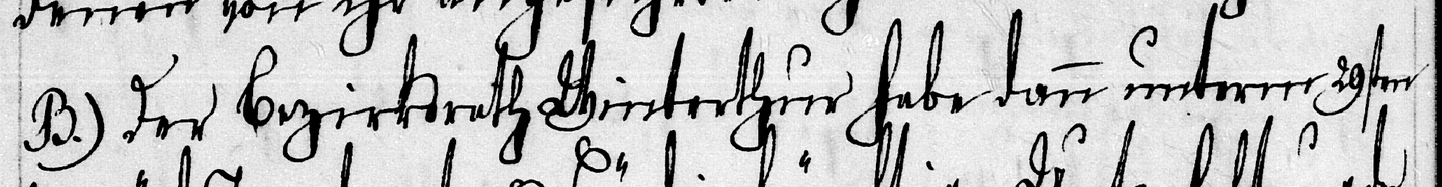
B.) Der Bezirksrath Winterthur habe dann unterm 29sten
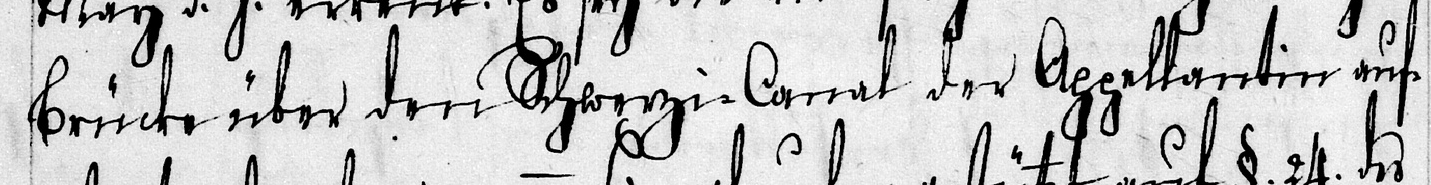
Brücke über den Schwerzi-Canal der Appellantin au¬
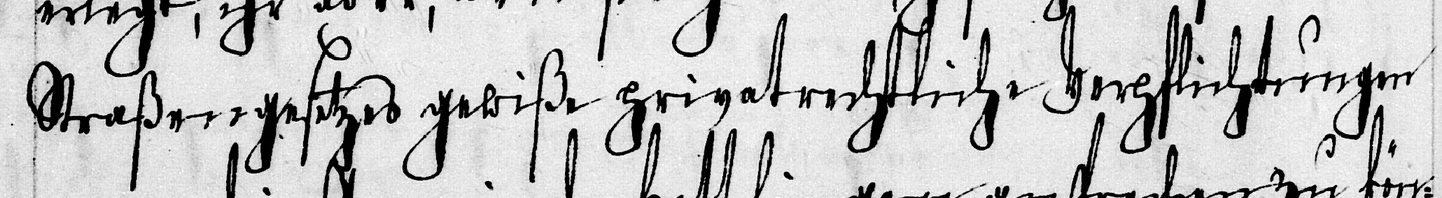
Straßengesetzes gewiße privatrechtliche Verpflichtungen
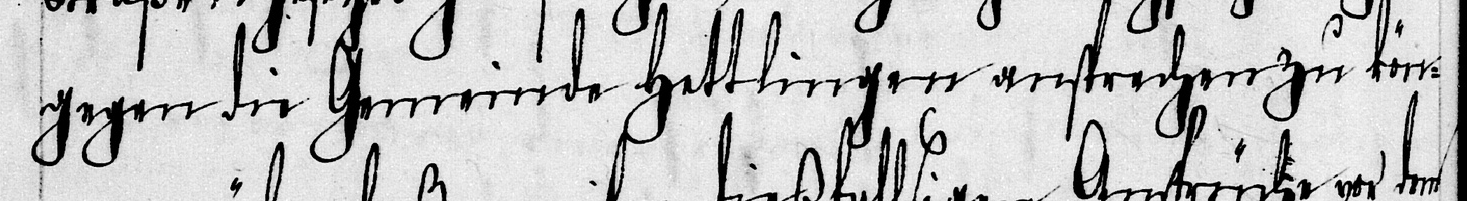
gegen die Gemeinde Hettlingen ansprechen zu kön¬
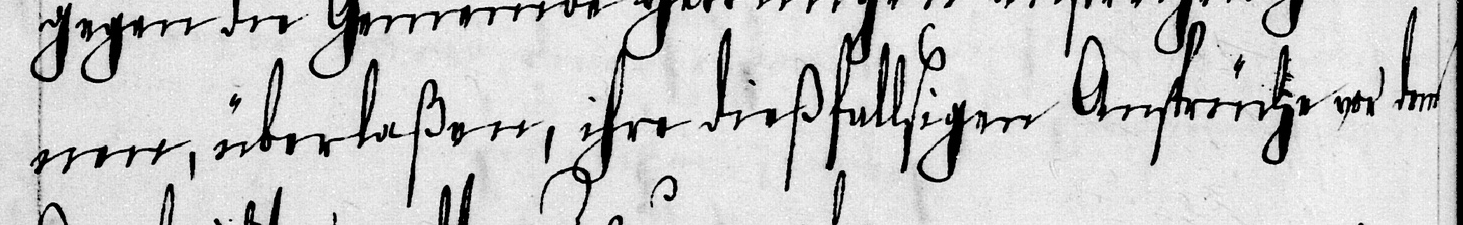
nen, überlaßen, ihre dießfälligen Ansprüche vor
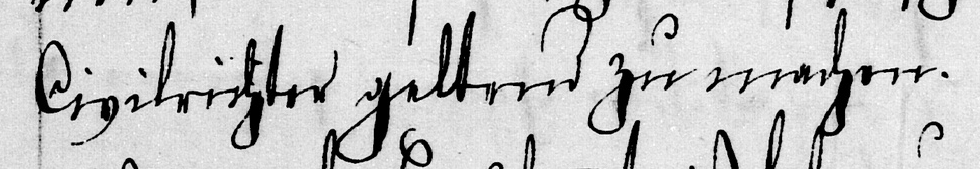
Civilrichter geltend zu machen.
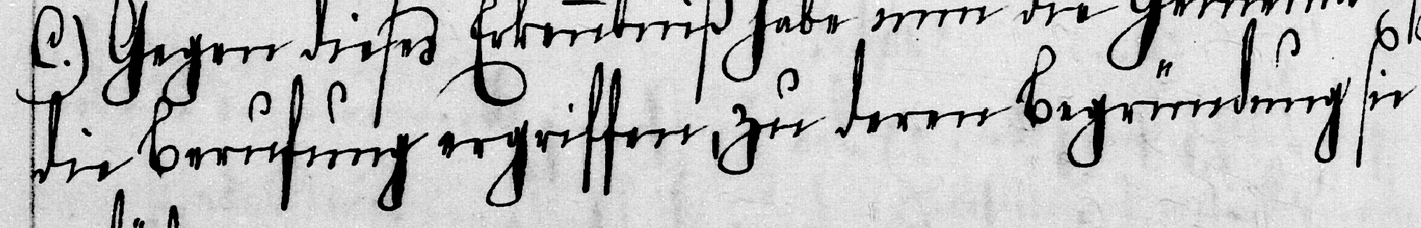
die Berufung ergriffen, zu deren Begründung sie
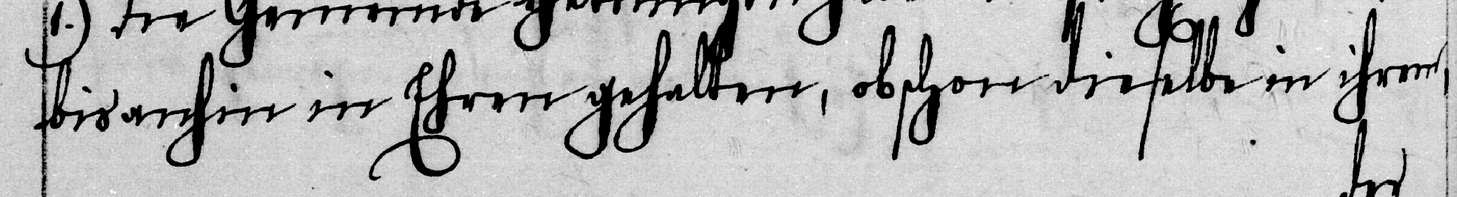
bis anhin in Ehren gehalten, obschon dieselbe in ihrem,
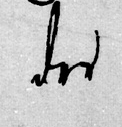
des
